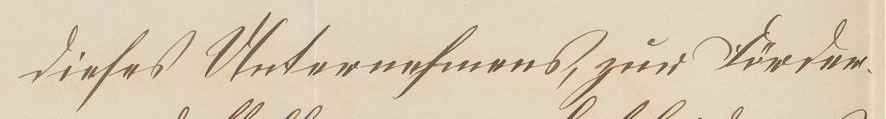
dieses Unternehmens, zur Förder-
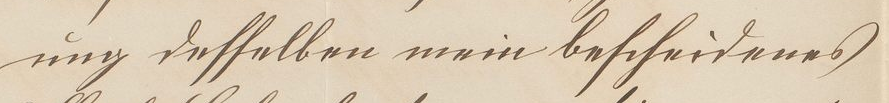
ung desselben mein bescheidenes
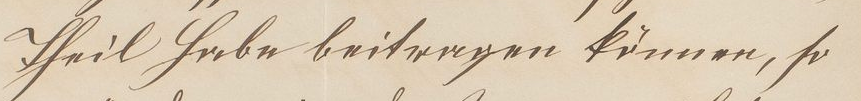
Theil habe beitragen können, so
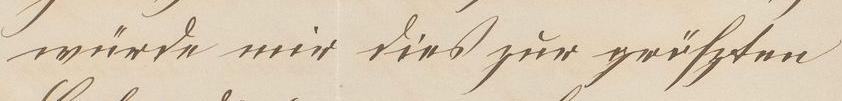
würde mir dies zur gröszten
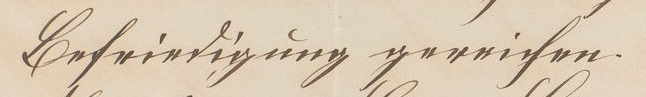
Befriedigung gereichen.
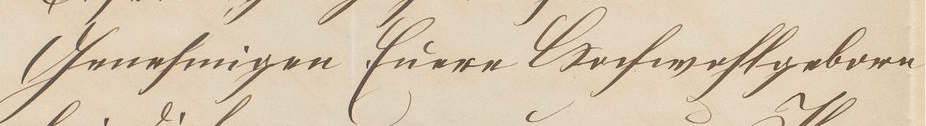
Genehmigen Euere Hochwohlgeborn
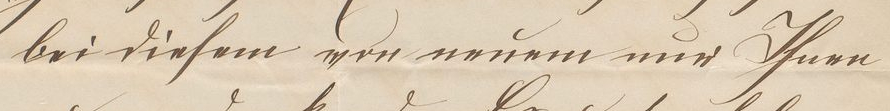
bei diesem von neuem nur Ihnen
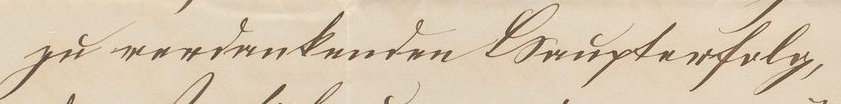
zu verdankenden Haupterfolg,
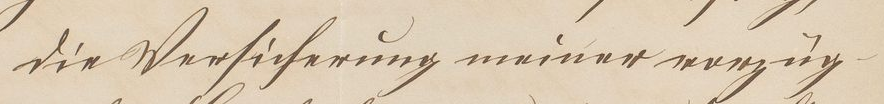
die Versicherung meiner vorzüg-
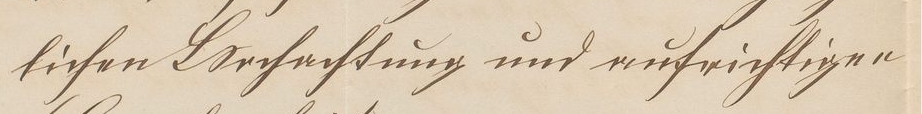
lichen Hochachtung und aufrichtigen
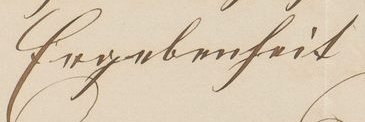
Ergebenheit
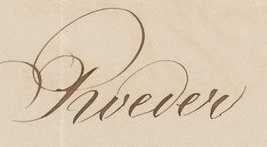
Roeder
